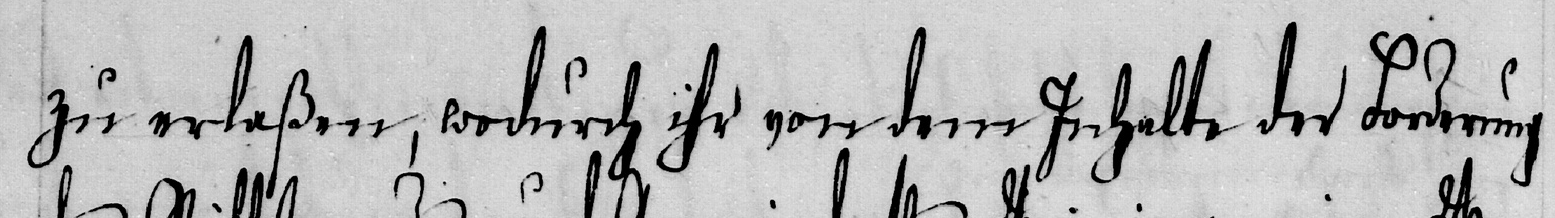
zu erlaßen, wodurch ihr von dem Inhalte der Forderu¬
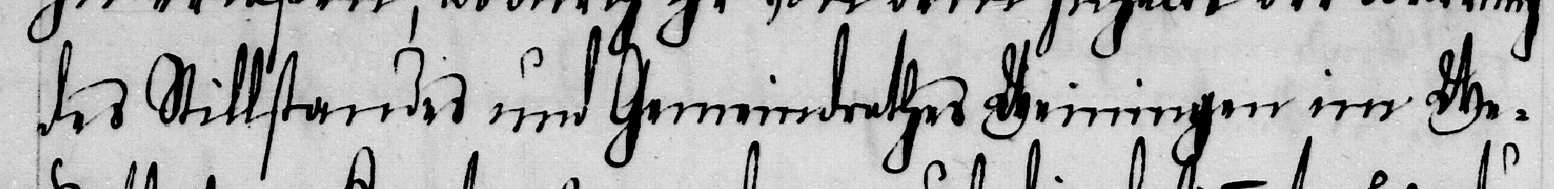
des Stillstandes und Gemeindrathes Weiningen im We¬
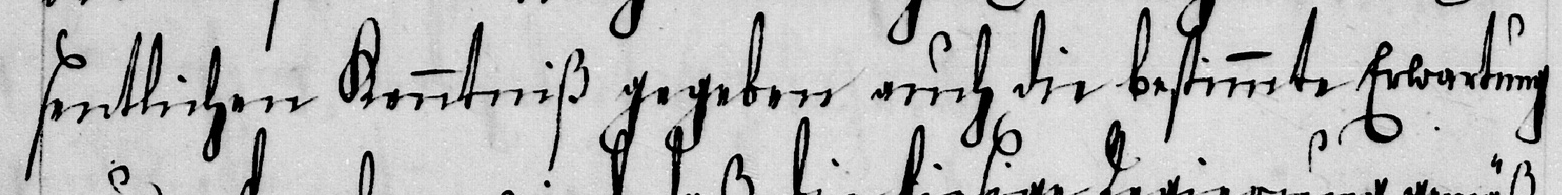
sentlichen Kenntniß gegeben auch die bestimmte Erwartung
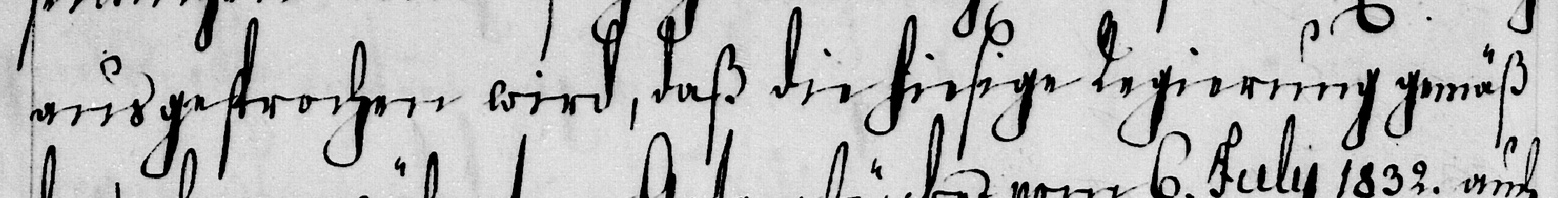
ausgesprochen wird, daß die hiesige Regierung gemäß
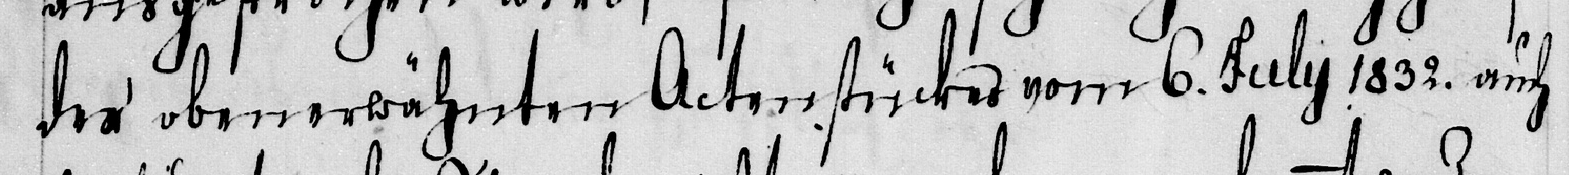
des oben erwähnten Actenstückes vom 6. July 1832. auch
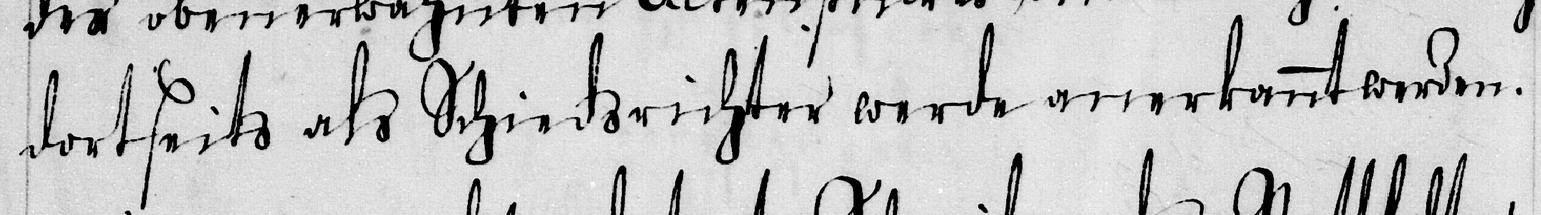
dortseits als Schiedsrichter werde anerkannt werden.
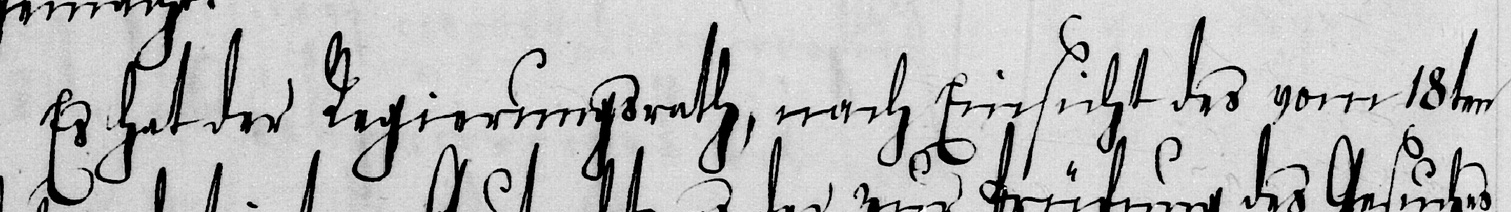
Es hat der Regierungsrath, nach Einsicht des vom 18ten
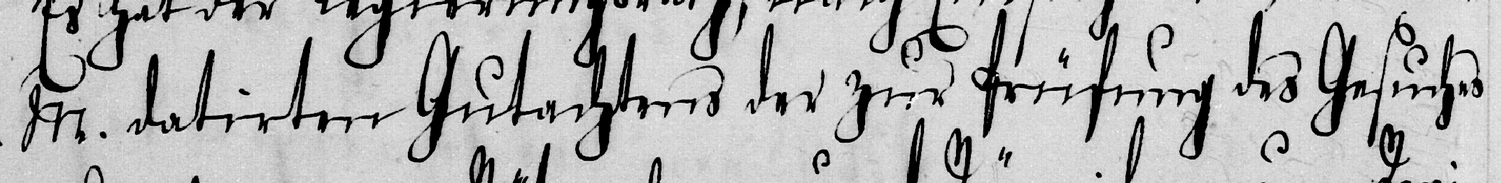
M. datirten Gutachtens der zur Prüfung des Gesuches
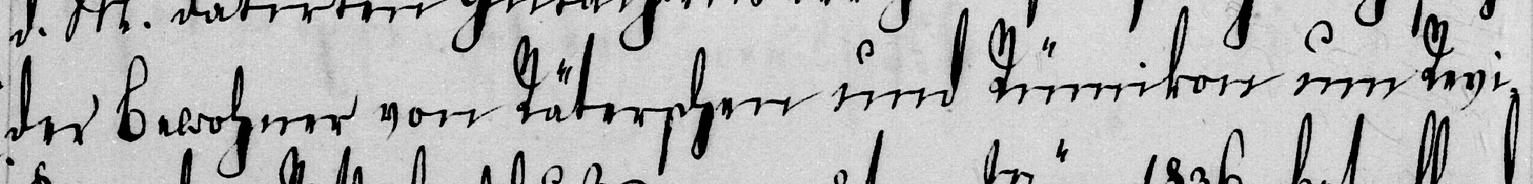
der Bewohner von Räterschen und Rümikon um Revi¬
